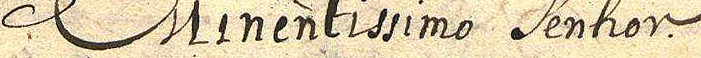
EMinentissimo Senhor.
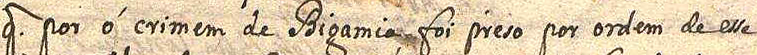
q̄. por ó crimem de Bigamia foi preso por ordem de esse
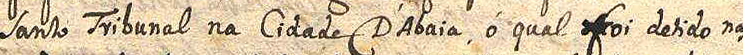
Santo Tribunal na Cidade D'Abaia, ó qual foi detido nas
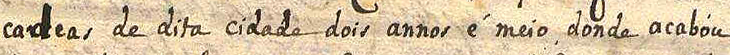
cadeas de dita cidade dois annos é meio, donde acabóu
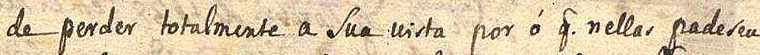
de perder totalmente a sua uista por ó q̄ nella padeseu
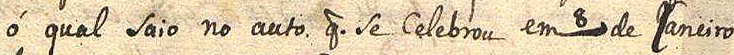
ó qual saio no auto. q̄. se Celebrou em 8 de Janeiro
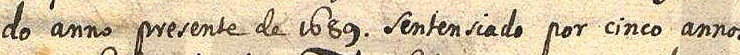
do anno presente de 1689. sentensiado por cinco annos
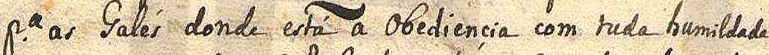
p.a as Galés donde está a obediençia com tuda humildade
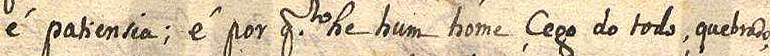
é patiensia; é porq̄.to he hum home, Cego do todo, quebrado,
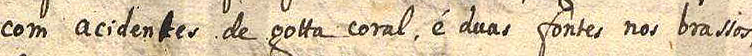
com acidentes de gotta coral, é duas fontes nos brassos,
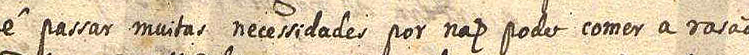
é passar muitas necessidades por naõ poder comer a rasaõ
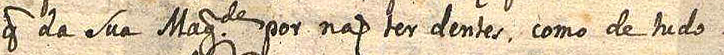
q̄ da Sua Mag.de por naõ ter dentes, como de tudo
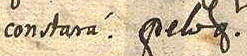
constará. pello q̄.
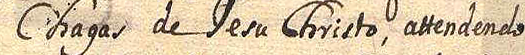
Chagas de Iesu Christo, attendendo
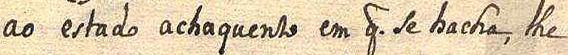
ao estado achaquento em q̄. se hacha, lhe
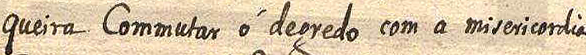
queira Commutar ó degredo com a misericordia
